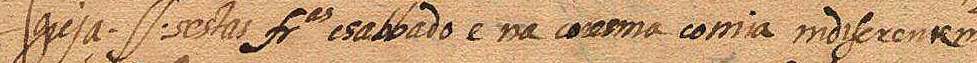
Jgreja .ss. sestas fras e sabbado e na coresma comia indiferentemte
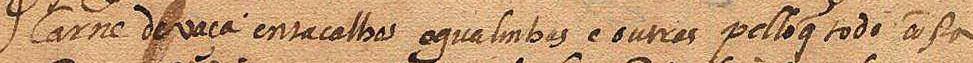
Carne de vaça entacolhos e gualinhas e outras pello q̄ todo c̄osta
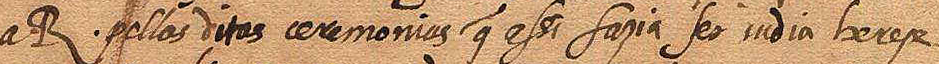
a .R. pellas ditas ceremonias q̄ assi fazia ser iudia hereje
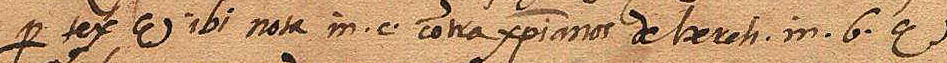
ꝑ tex et ibi nota in .c. c̄otra xp̄ianos de hereti. in. 6. et
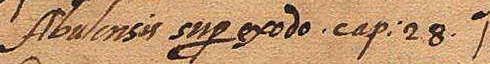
Abulensis suꝑ exodo .cap: 28. /
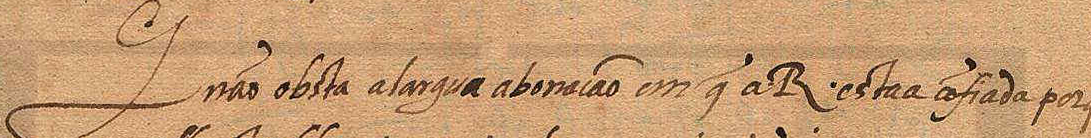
Que não obsta a largua abonacão q̄ a R. estaa c̄ofiada porq̄
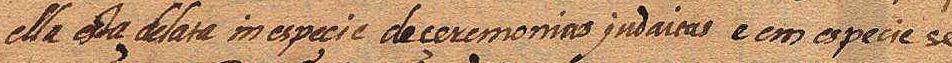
ella esta delata in espeçie de çeremonias judaicas e em especie se
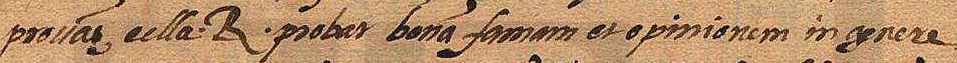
prouão e ella .R. probat bonā famam et opinionem in genere
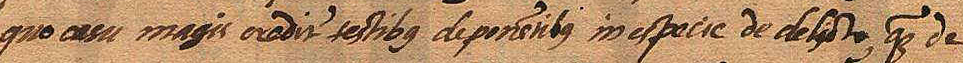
quo casu magis credit̄ testibꝯ deponētibꝯ in especie de deljcto, q̄ꝫ de
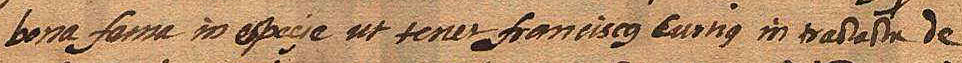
bona fama in espeçie ut tenet franciscꝯ curtiꝯ in tractactu de
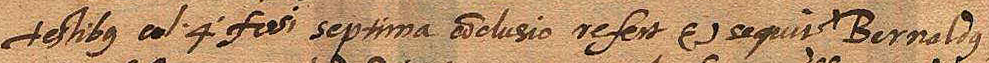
testibꝯ col. 4 fresi septima c̄oclusio refert et sequit Bernarldꝯ
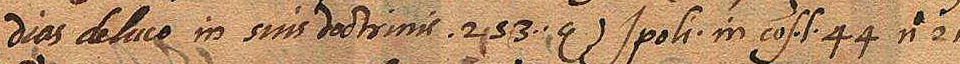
dias deluco in suis doctrinis .253. et Jpoli. in c̄os.l. 44 no 2i
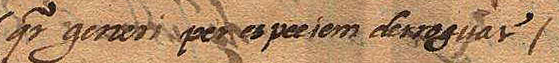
qr̄ generi per especiem derroguat̄ /
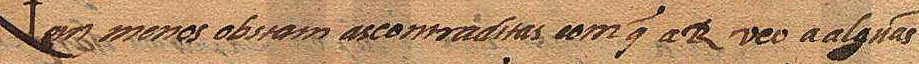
Nam menos obstam as contraditas com q̄ a R veo a alguās
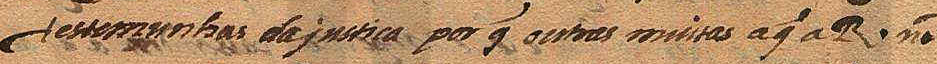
tetemunhas da justica por q̄ outras muitas a q̄ a R. nō
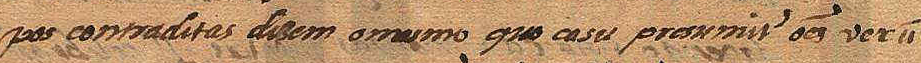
pos contraditas dizem o mesmo quo casu presumit̄ ōes verū
